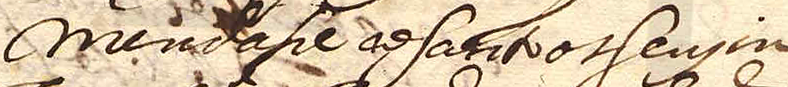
mendasse ao Santo os Seus in
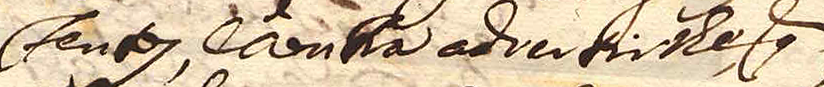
tentos, e a outra advertirlhe, q̄
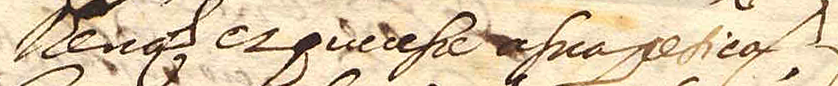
lhe naõ esquecesse a sua peticaõ
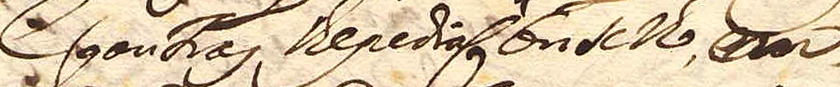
E q̄ outras lhe pediaõ Conselho, ou
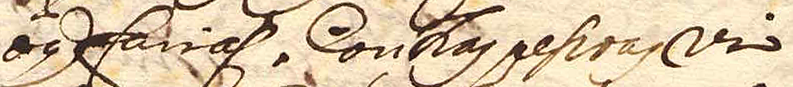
o q̄ fariaõ, E outras pessoas vio
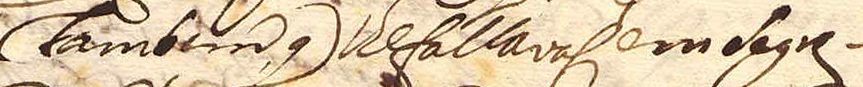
tambem, q̄ lhe fallavaõ em Segre
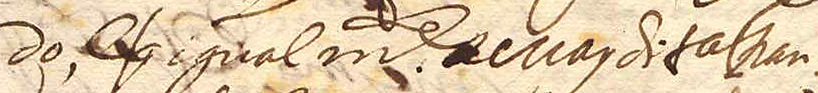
do, E q̄ igualm.te a May dita Fran
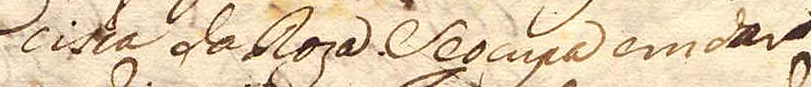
cisca da Rosa Se ocupa em dar
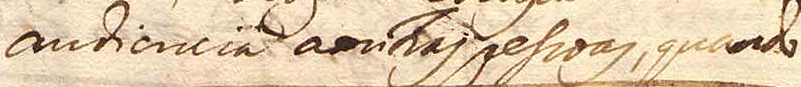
audiencia a outras pessoas, quando
